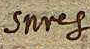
snres̄
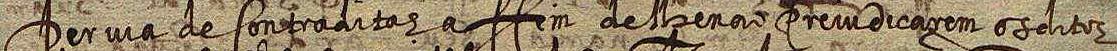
Per uia de Contraditas affim de lhe naõ preiudicarem os ditos
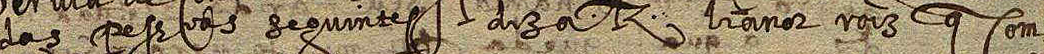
das pessoas seguintes diz a .R. lianor roīz q̄ Com
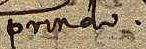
prindo.
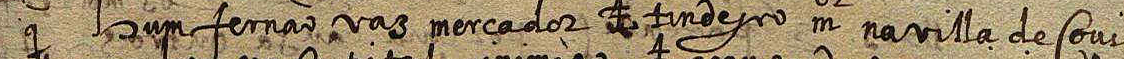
q̄ hum fernão vaz mercador E tindejro mor na villa de Coui
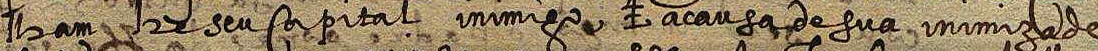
lham he seu Capital inimigo, E a causa de sua inimizade
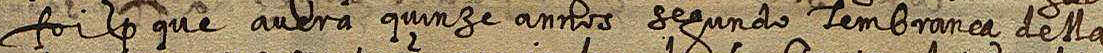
foi p̄ que auera quinze annos segundo lembrança della
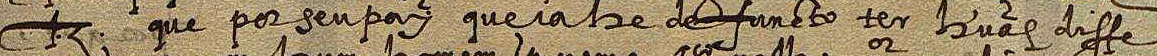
.R. que por seu pay que ia he defuncto ter huās diffe
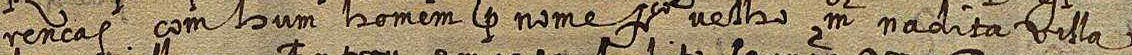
renças com hum homem p̄ nome frco uelho mor na dita villa
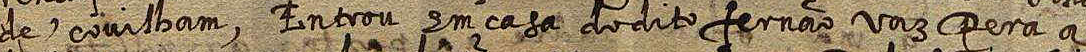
de couilham, Entrou Em casa do dito fernão vaz Pera a
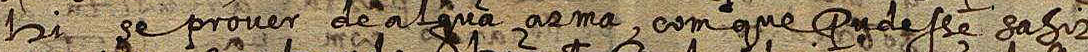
hi se prouer de algūa arma, com que Pudesse sahir
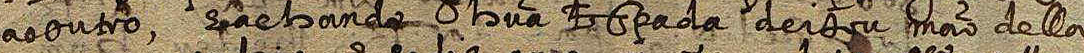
ao Outro, E achando hūa Espada deitou maõ della
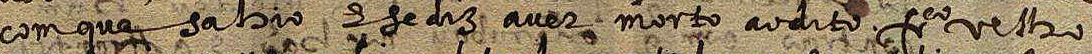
com que sahio E se diz auer morto ao dito frco velho
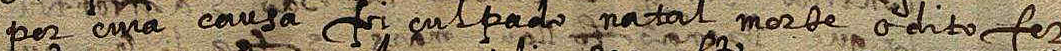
por cuīa causa foi culpado na tal morte o dito fer
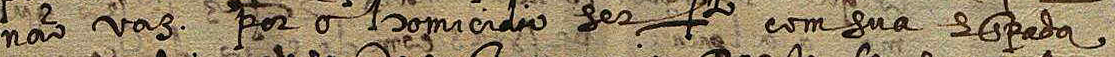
não vaz. por o homicidio ser fto com sua Espada
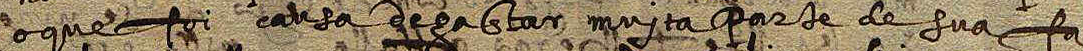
o que foi causa de gastar mujta Parte de sua fa
